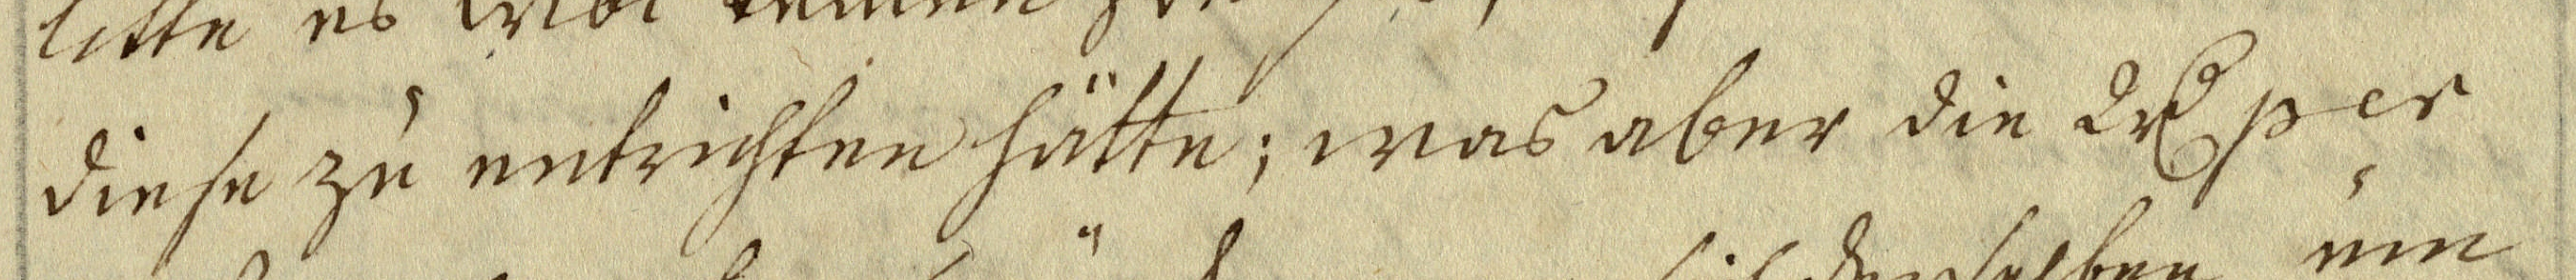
diese zu entrichten hätte; was aber die 2 rl. per
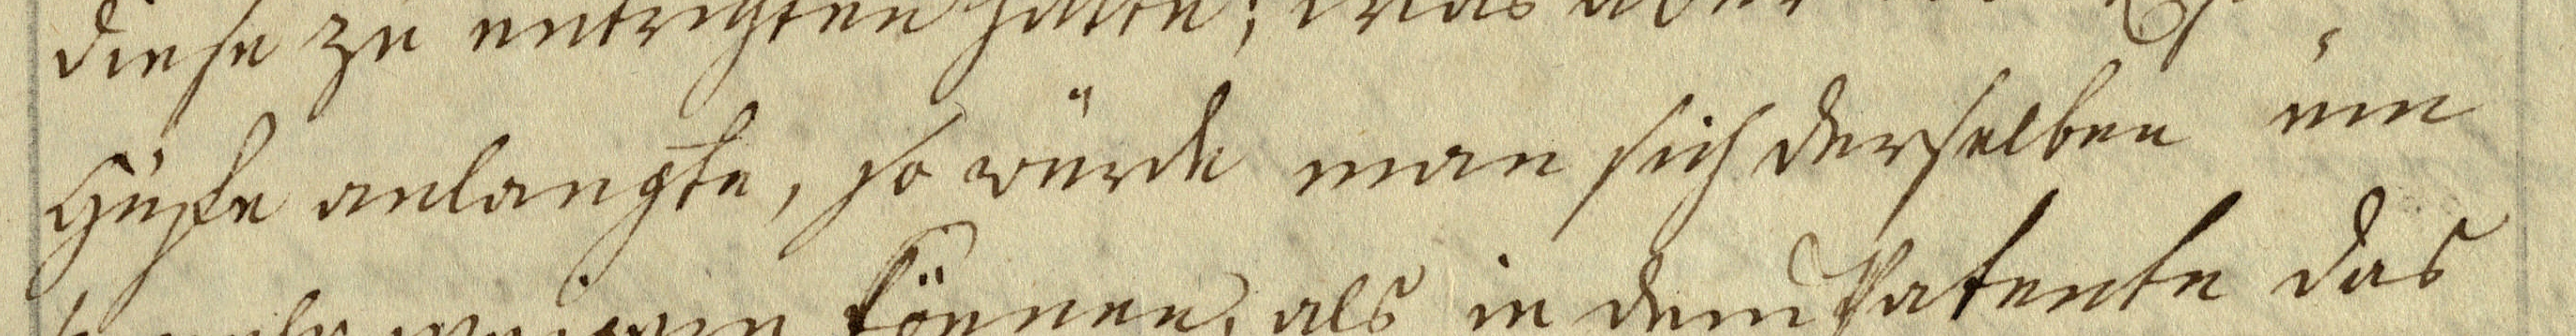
Hufe anlangte, so würde man sich derselben um
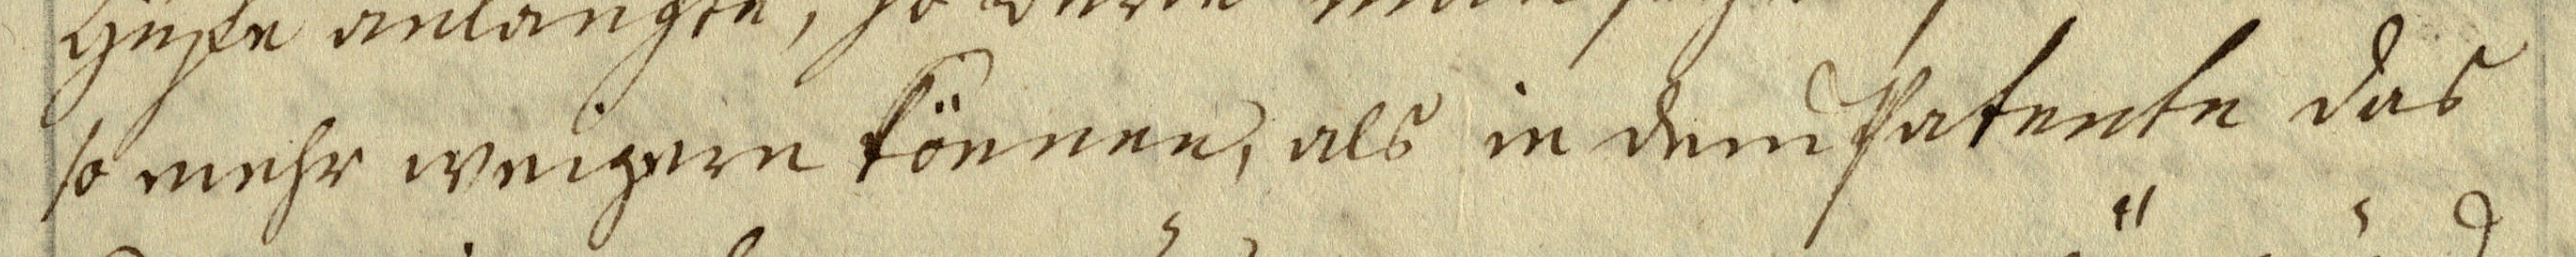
so mehr weigern können, als in dem Patente das
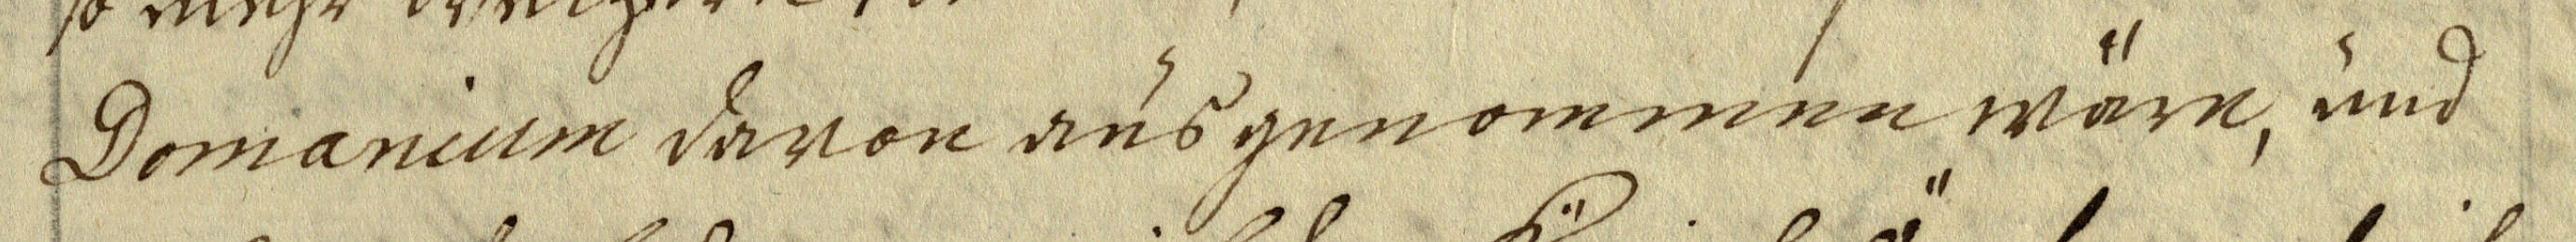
Domanium davon ausgenommen wäre, und
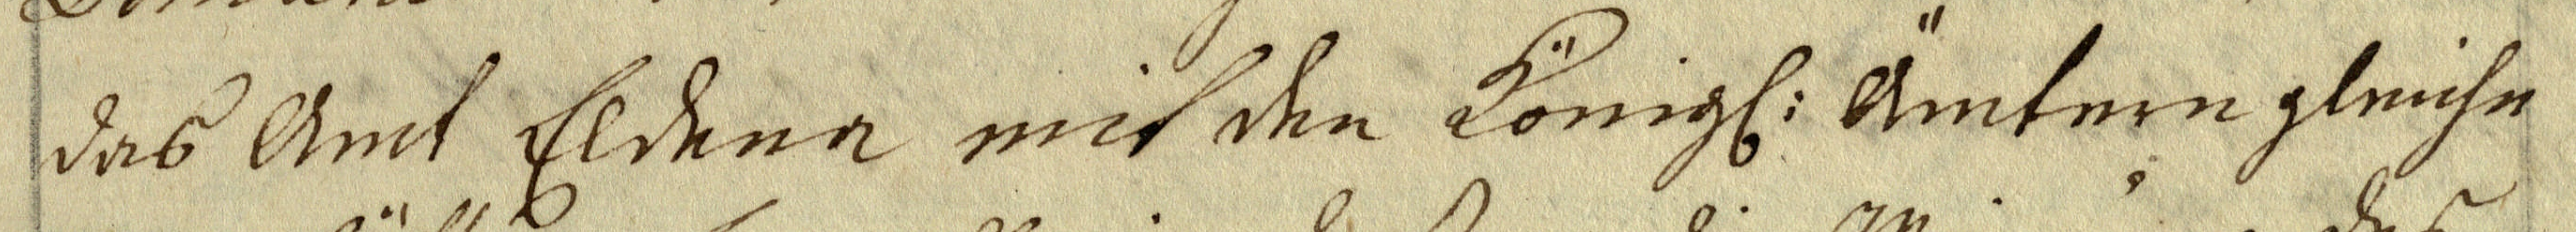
das Amt Eldena mit den Königl. Ämtern gleiche
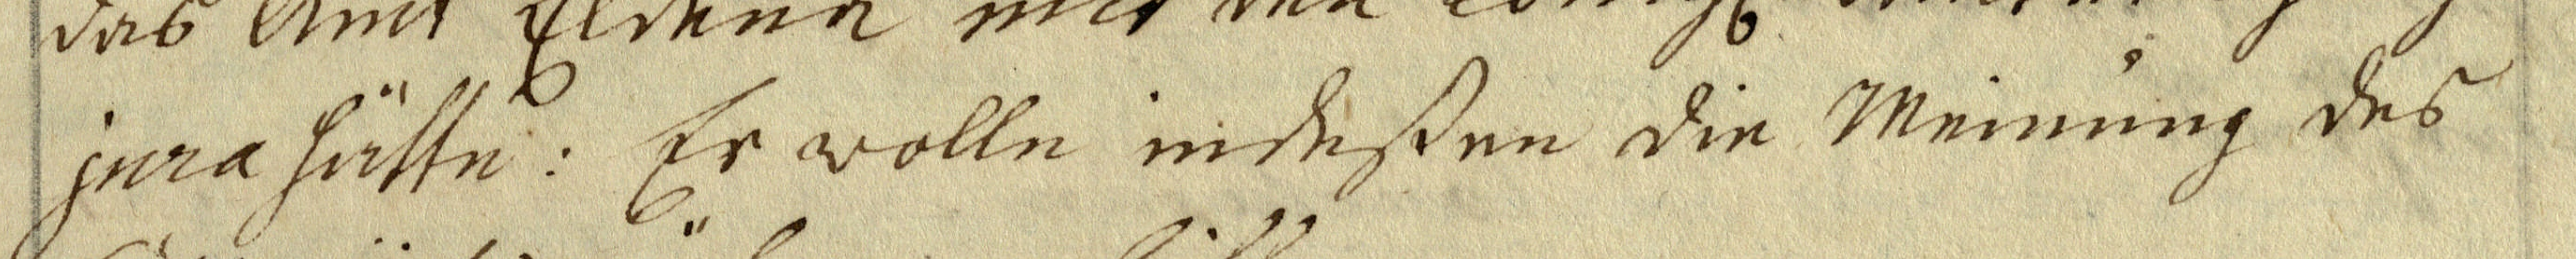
jura hätte. Er wolle indeßen die Meinung des
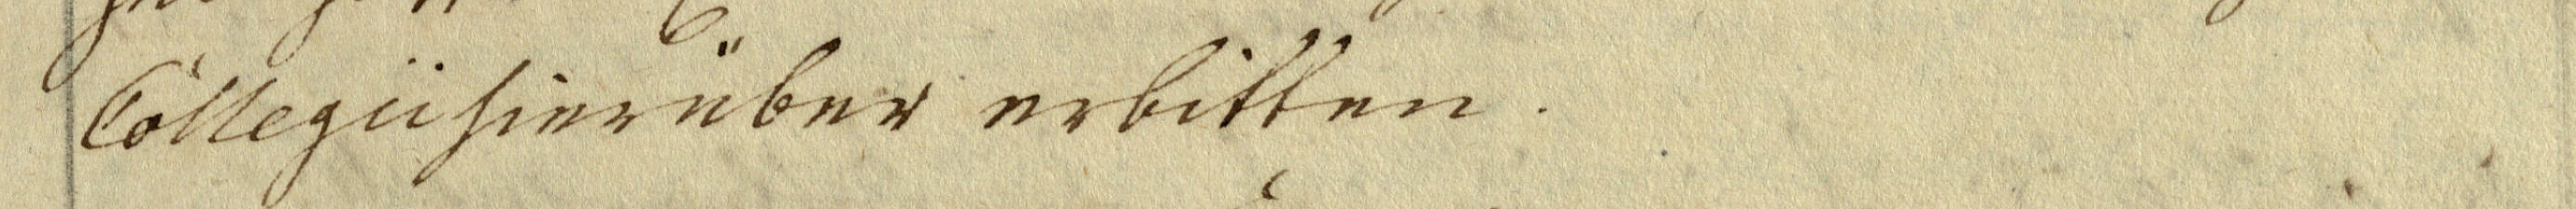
Collegii hierüber erbitten.
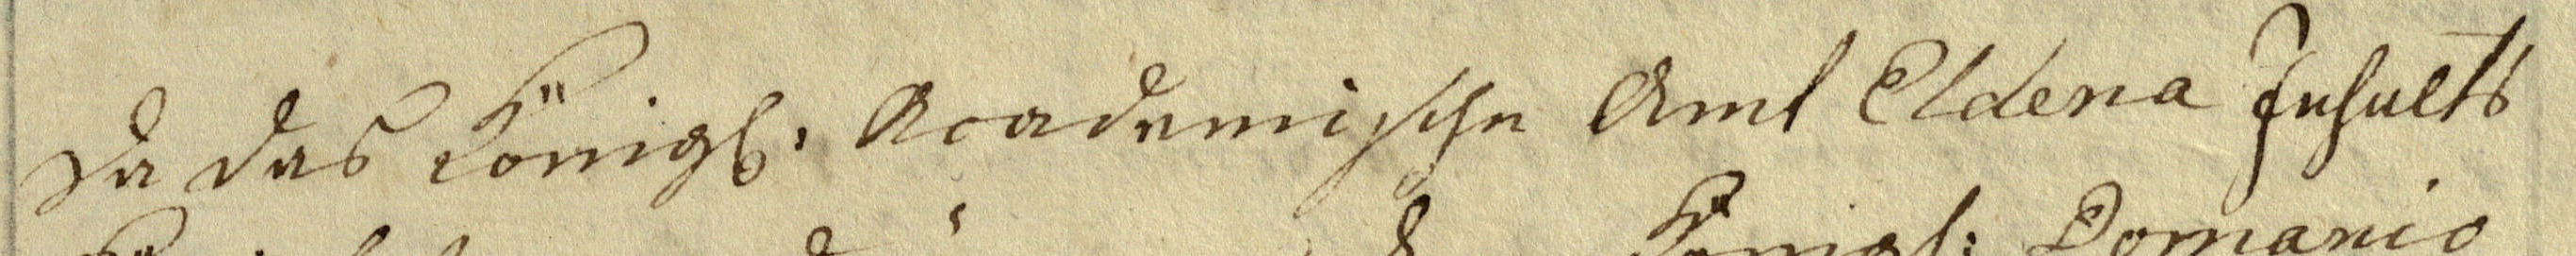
Da das Königl. Academische Amt Eldena Inhalts
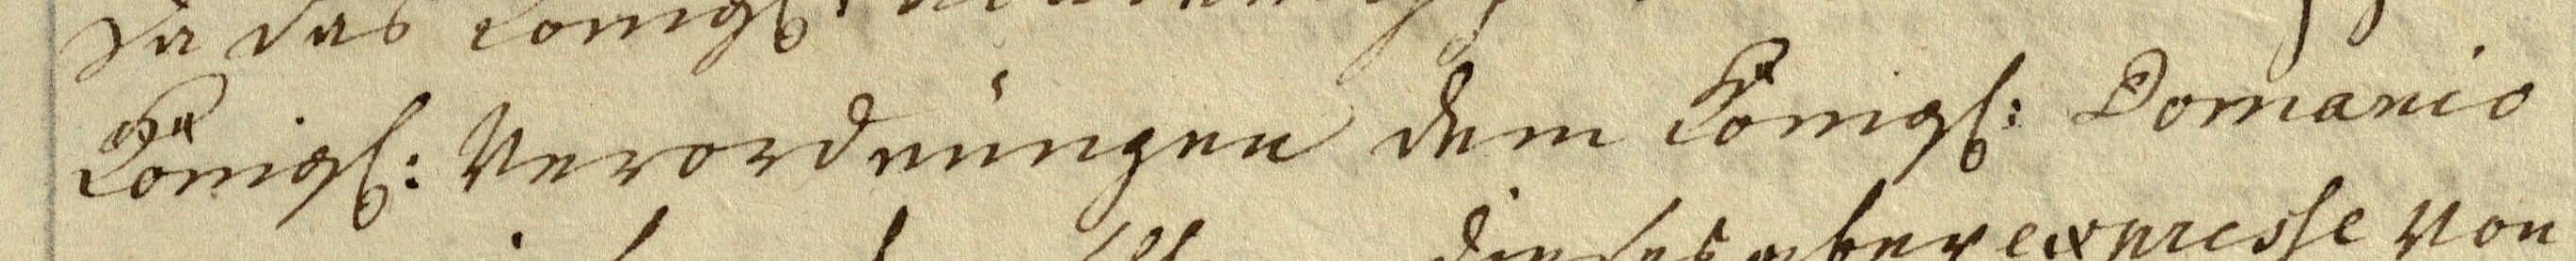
Königl. Verordnungen dem Königl. Domanio
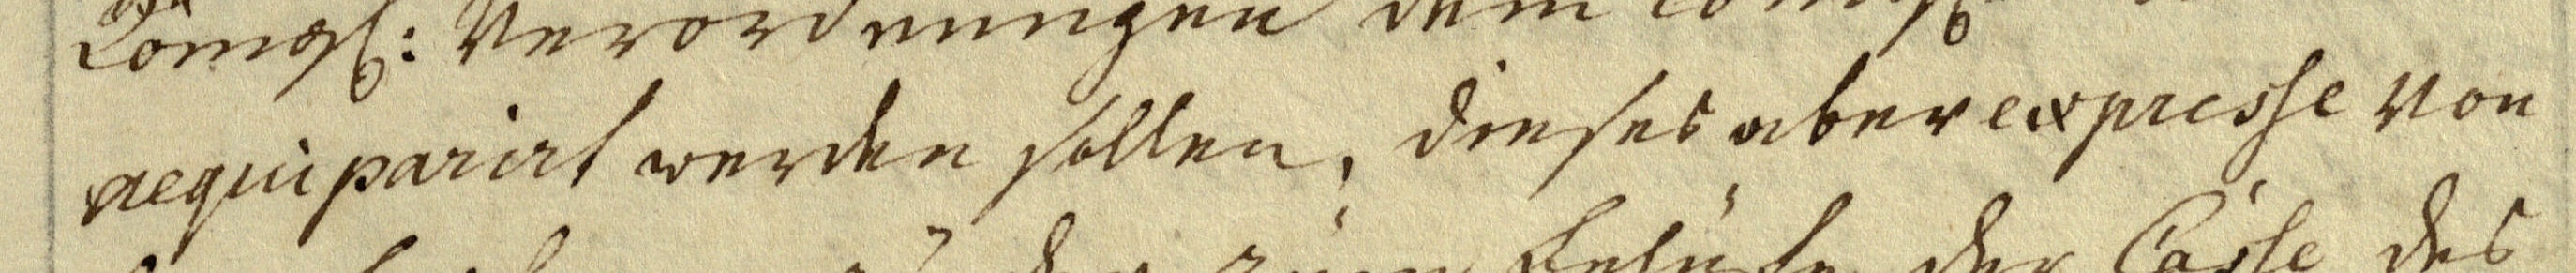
aequiparirt werden sollen, dieser aber expresse
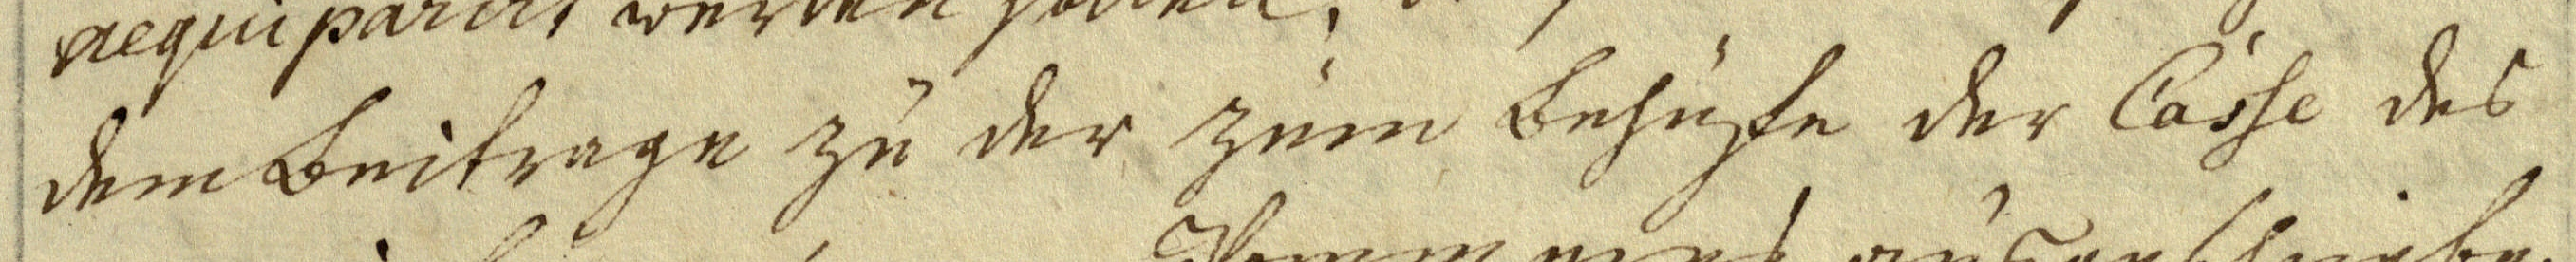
von dem Beitrage zu der zum Behufe der Casse des
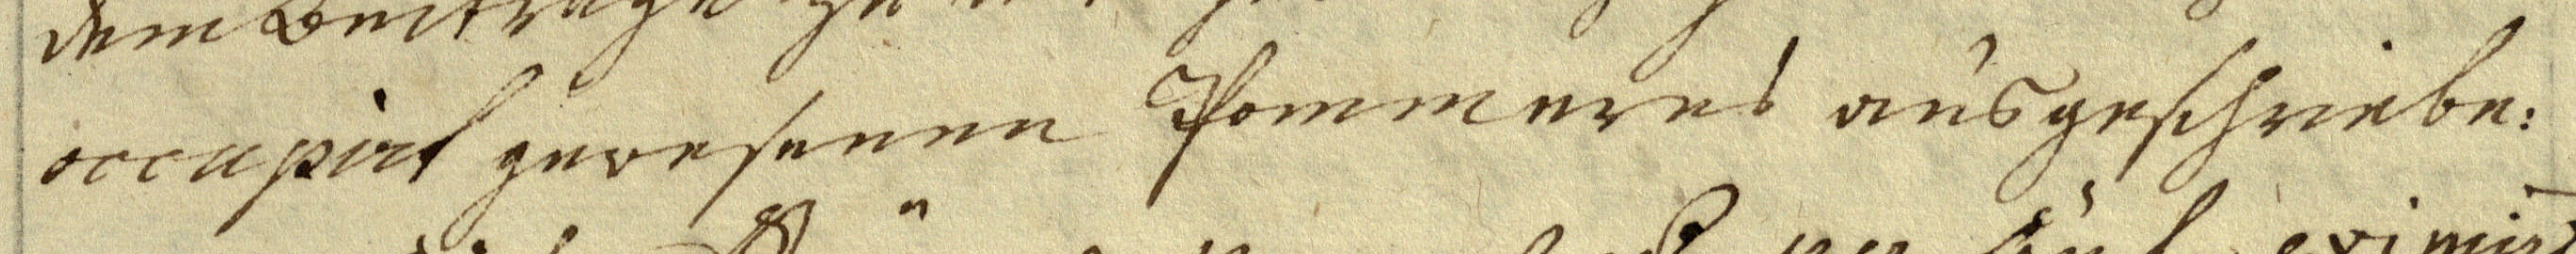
occupirt gewesenen Pommerns ausgeschriebe¬
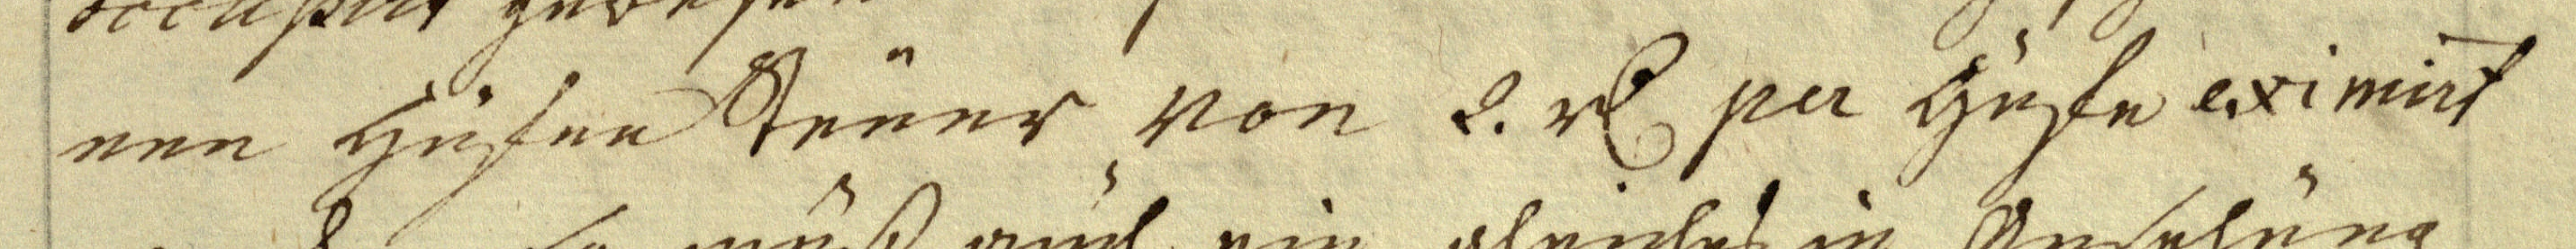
nen Hufen Steuer von 2 rl. per Hufe eximirt
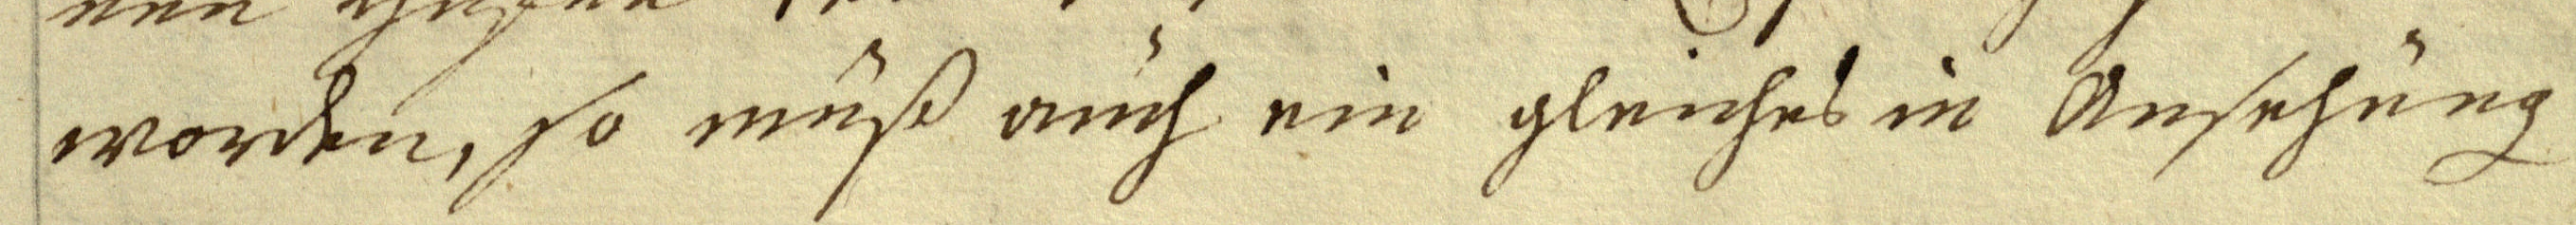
worden, so muß auch ein gleiches in Ansehung
